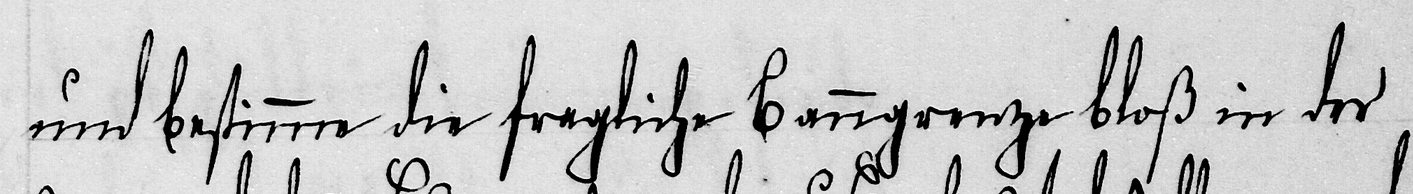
und bestimme die fragliche Banngrenze bloß in der
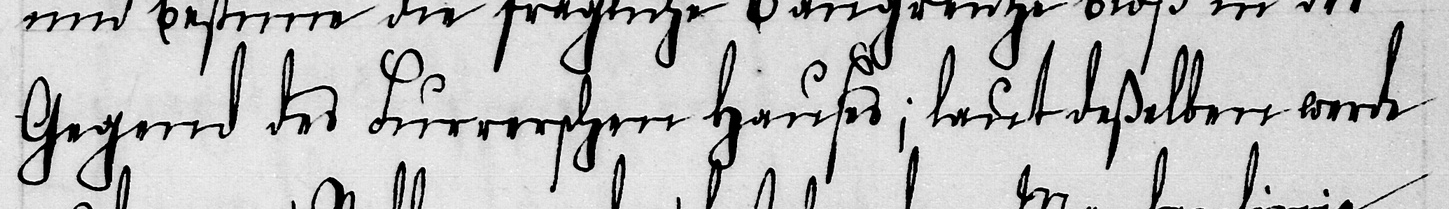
Gegend des Furrerschen Hauses; laut deßelben werde
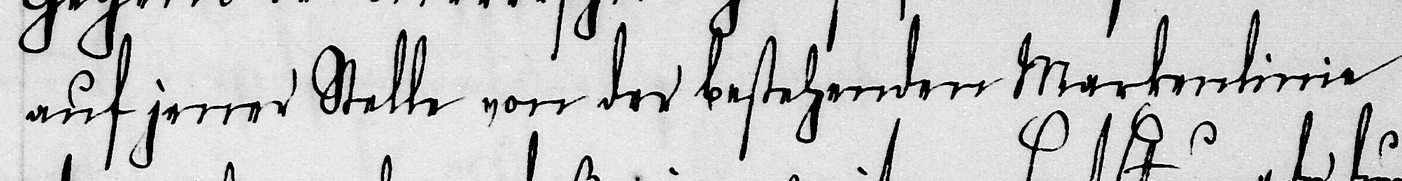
auf jener Stelle von der bestehenden Markenlinie
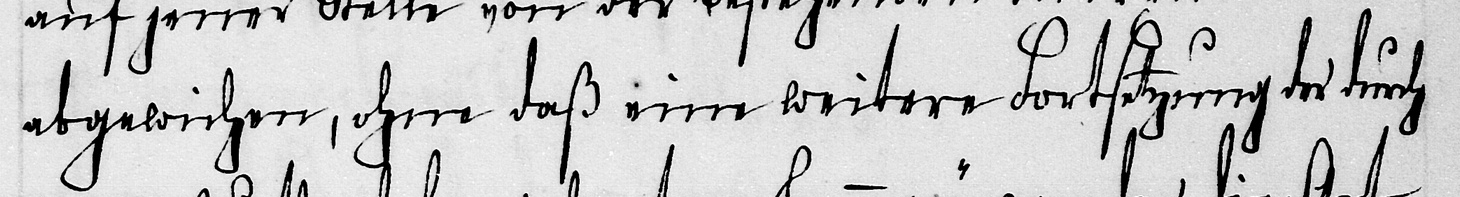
abgewichen, ohne daß eine weitere Fortsetzung der durch
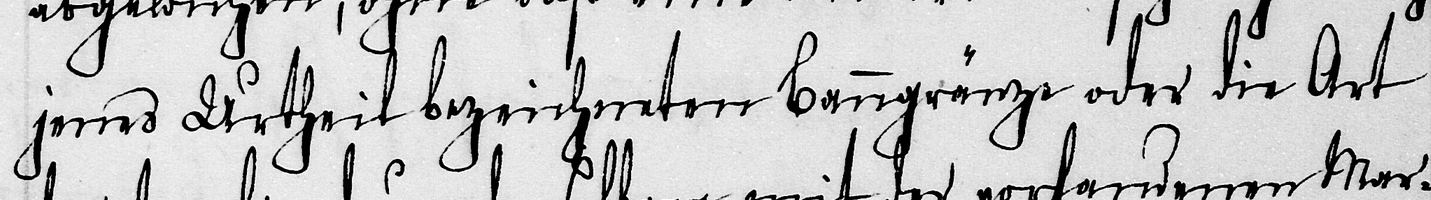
jenes Urtheil bezeichneten Banngränze oder die Art
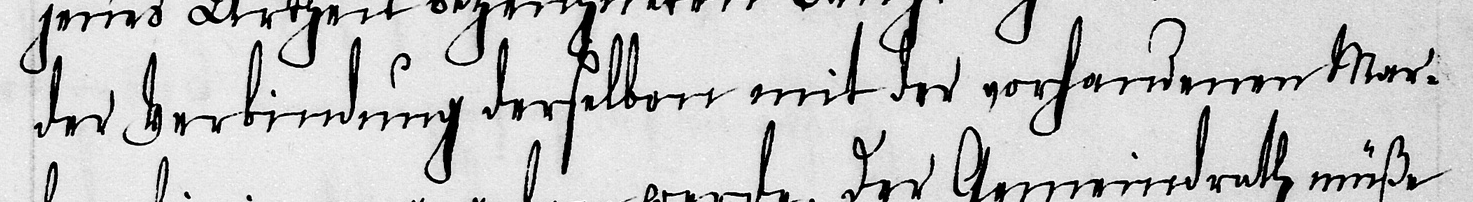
der Verbindung derselben mit der vorhandenen Mar¬
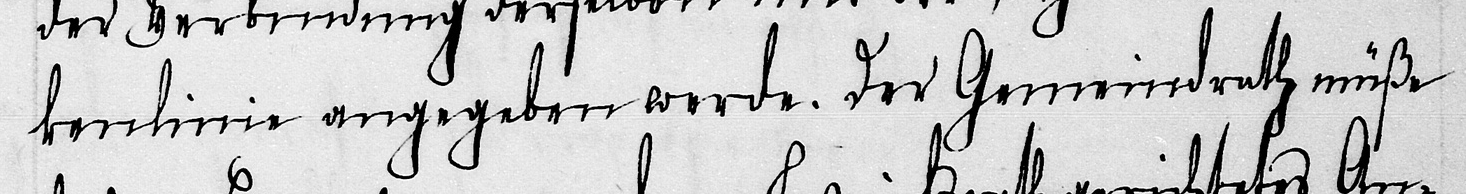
kenlinie angegeben werde. Der Gemeindrath müße
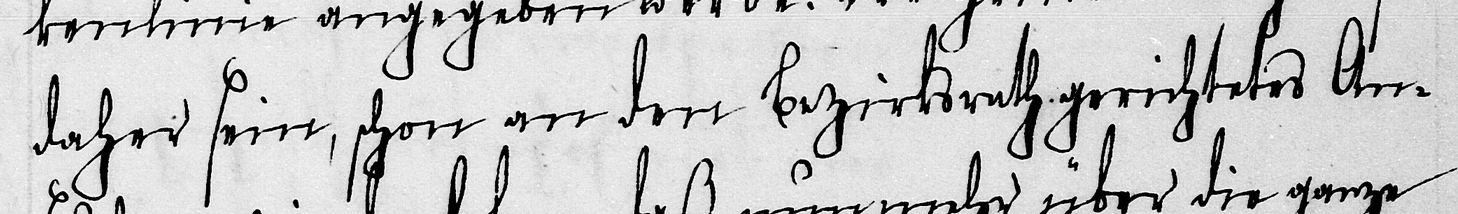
daher sein, schon an den Bezirksrath gerichtetes An¬
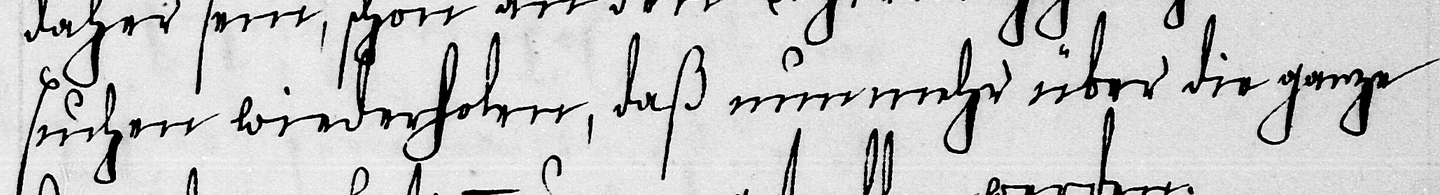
suchen wiederholen, daß nunmehr über die ganze
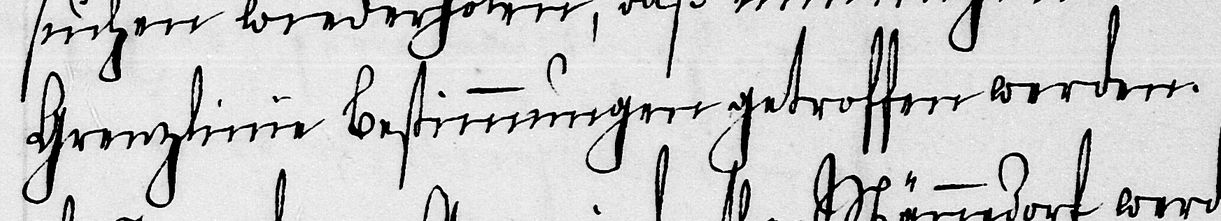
Grenzlinie Bestimmungen getroffen werden.
